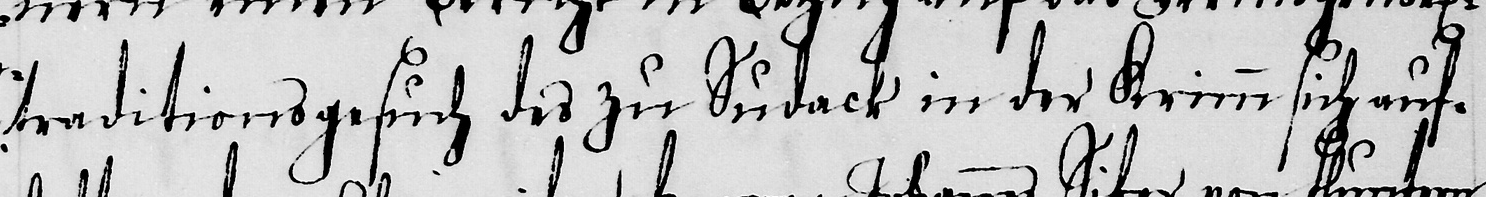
traditionsgesuch des zu Sudack in der Krimm sich auf¬
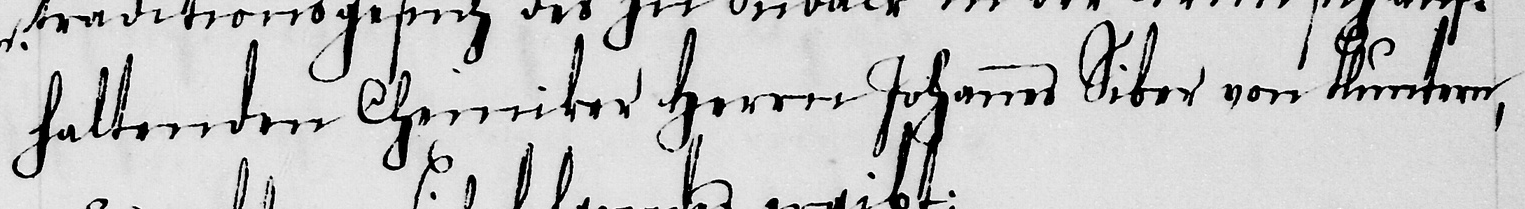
haltenden Chemiker Herrn Johannes Siber von Fluntern,
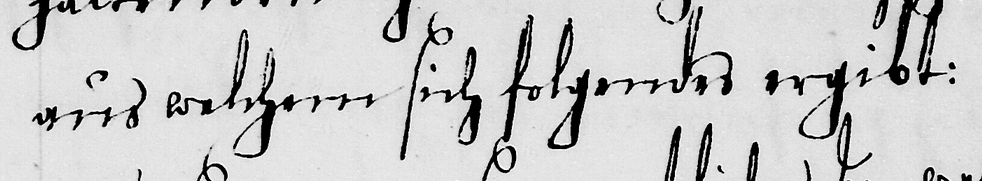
aus welchem sich folgendes ergibt:
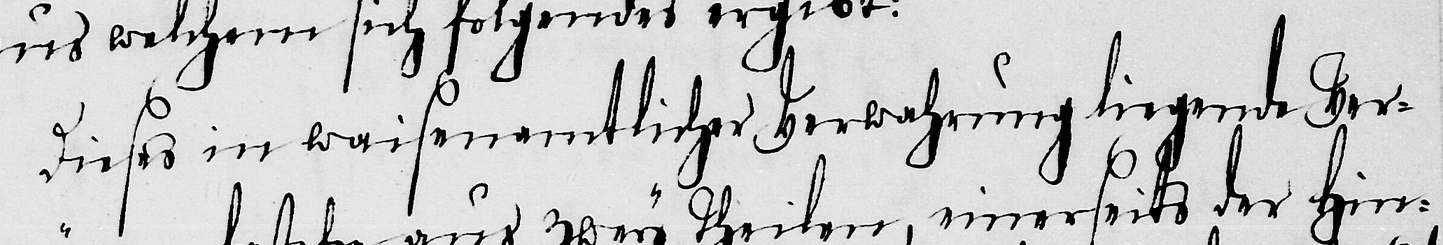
Dieses in waisenamtlicher Verwahrung liegende Ver¬
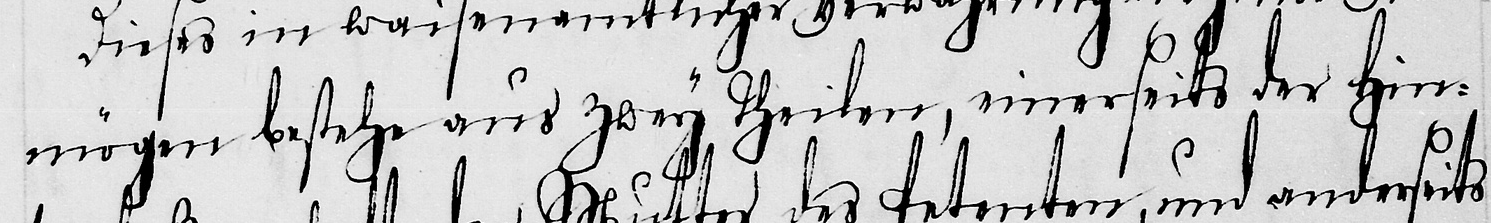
mögen bestehe aus zwey Theilen, einerseits der Hin¬
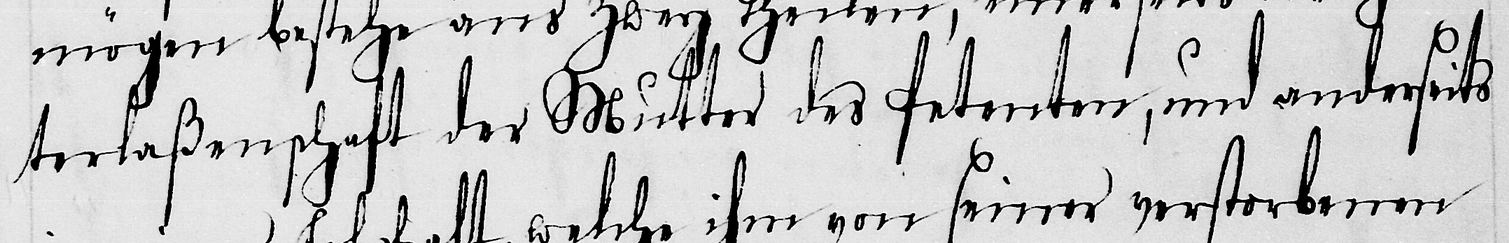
terlassenschaft der Mutter des Petenten, und anderseits
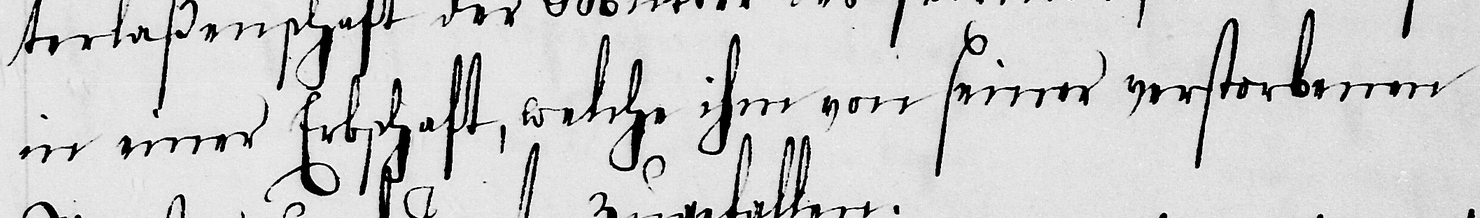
in einer Erbschaft, welche ihm von seiner verstorbenen
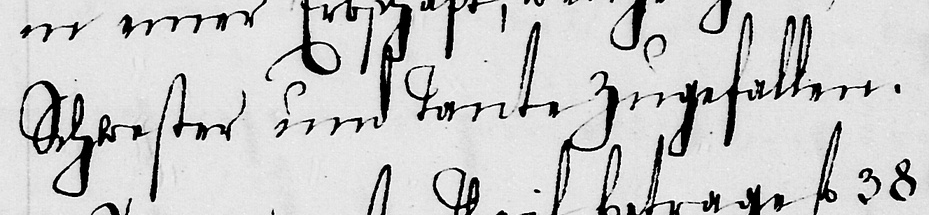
Schwester und Tante zugefallen.
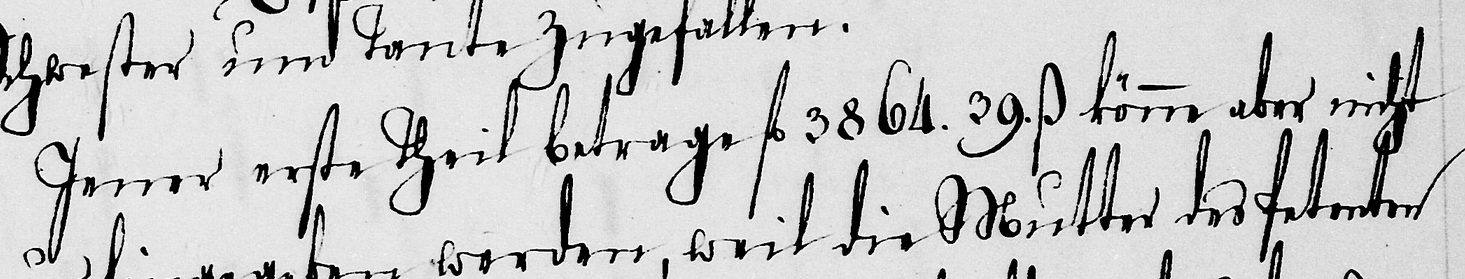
Jener erste Theil betrage fl. 3864. 39. ß könne aber nicht
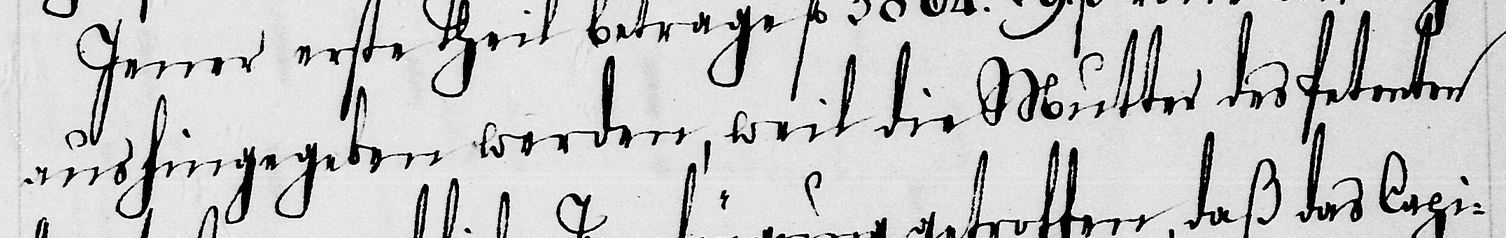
aushingegeben werden, weil die Mutter des Petenten
